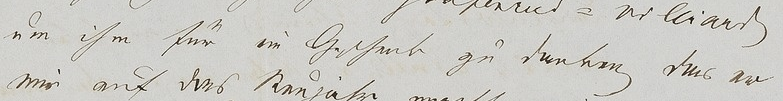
um ihm für ein Geschenk zu danken das er
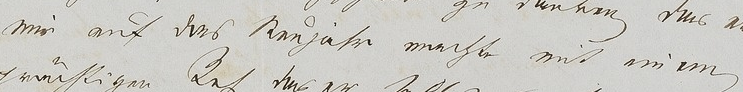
mir auf das Neujahr machte mit einem
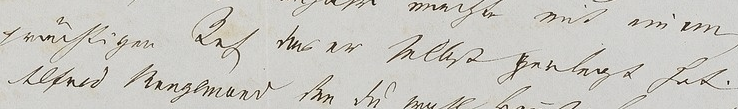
prächtigen Reh das er selbst zerlegt hat.
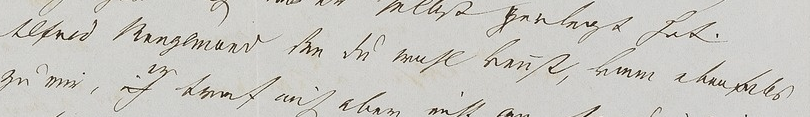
Alfred Renglmund den Du wohl kennst, kam ebenfalls
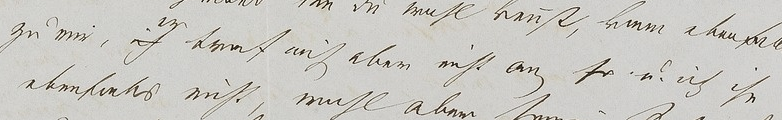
zu mir, icher traf mich aber nicht an so u. ich ihn
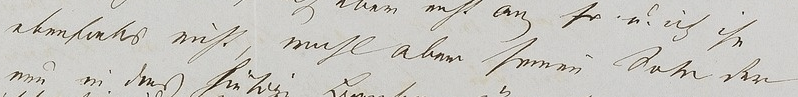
ebenfalls nicht, wohl aber seinen Sohn der
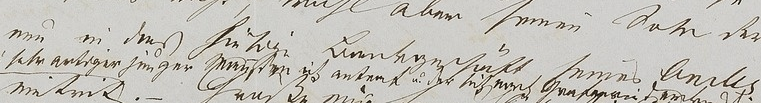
nun in das hiesige Bankgeschäft seines Oncles
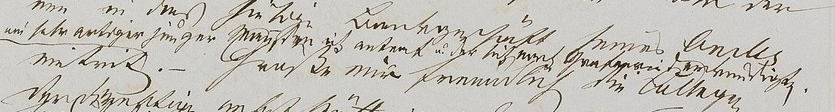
ein sehr artiger junger Mann den ich antraf u. der sich nach Grafenried erkundigte. –
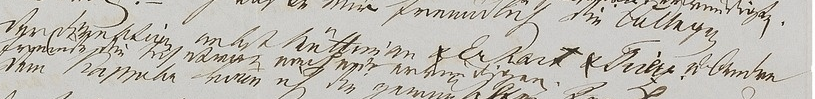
der Direktion, nebst Rüttimann & Erhart & ... u. Andre
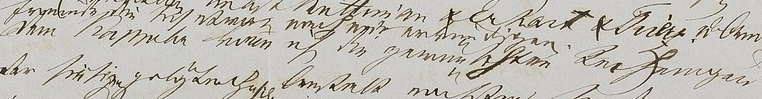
Dem Kappeler kann ich die gewünschten Rechnungen
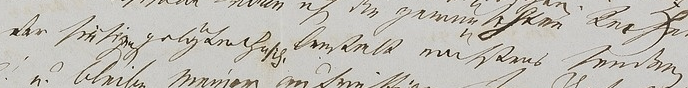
der hiesigen polytechnsch. Anstalt nächstens senden.
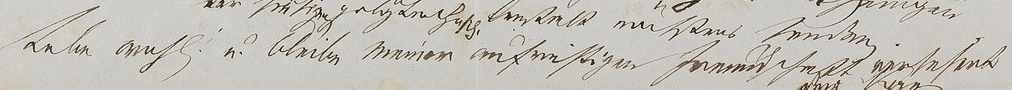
Lebe wohl u. bleibe meiner aufrichtigen Freundschaft versichert
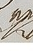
Dein
